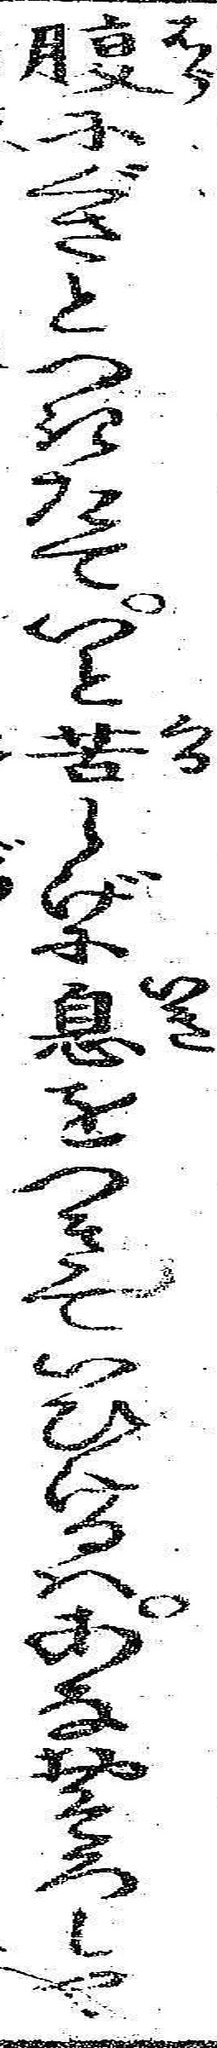腹にぐさとつきたて。いと苦しげに息をつきていひけるは。あなおそろしや
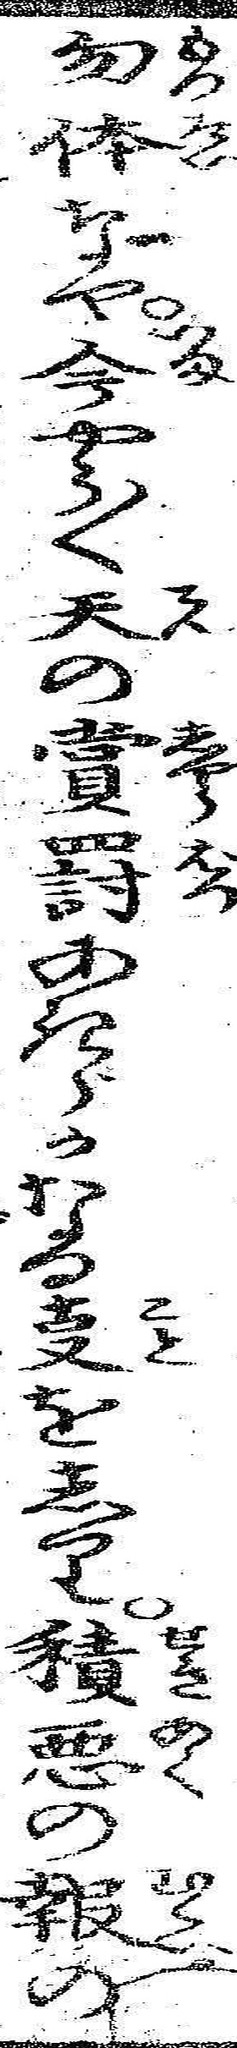勿体なや。今やう〳〵天の賞罰あきらかなる事をしり。積悪の報の
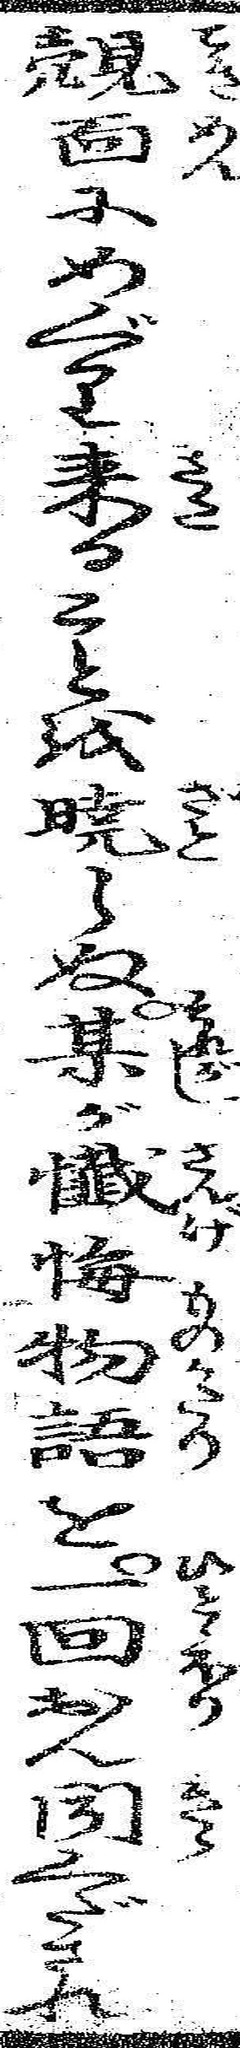覿面にめぐり来ることを暁らぬ。某が懺悔物語を。一回おん聞くだされ
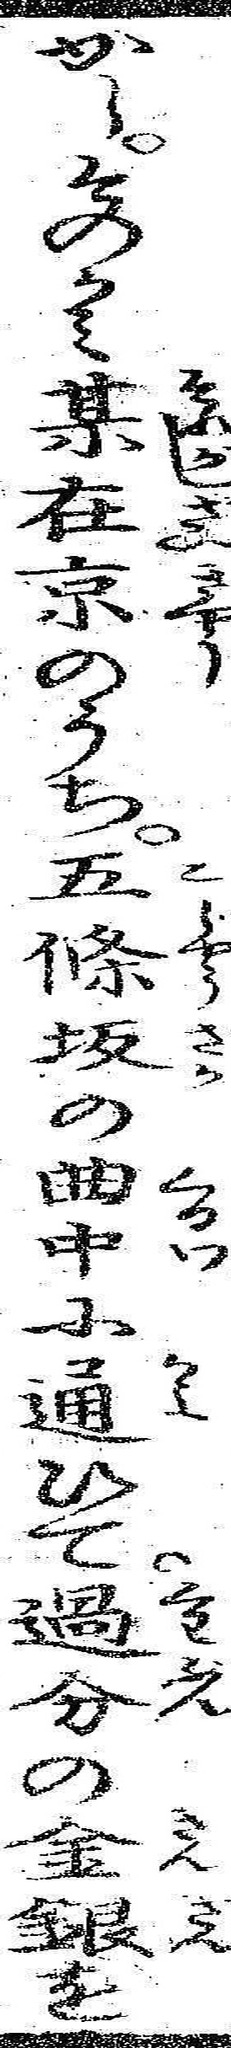かし。そのかみ某在京のうち。五条坂の曲中に通ひて。過分の金銀を
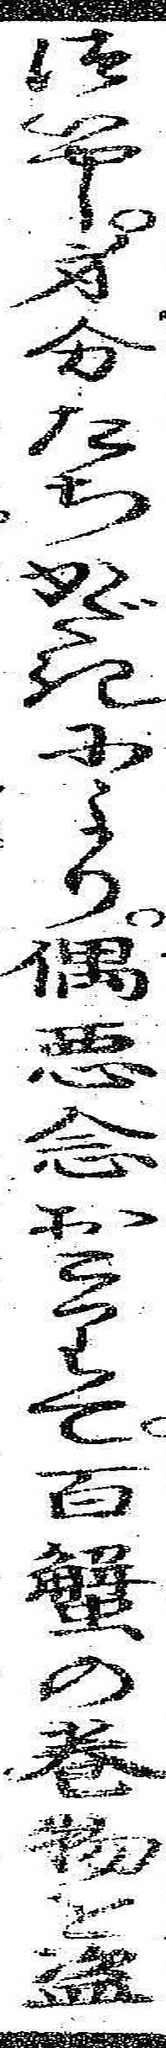ついやし。身分たちかだきにより。偶悪念おこりて。百蟹の巻物を盗
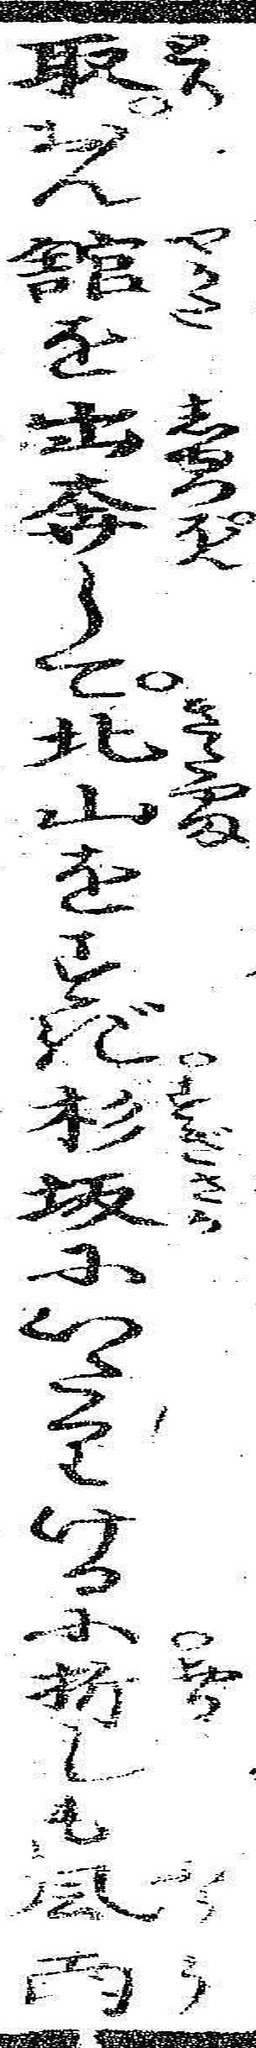取。おん館を出奔して。北山をすぎ。杉坂にいたりけるに。折しも風雨
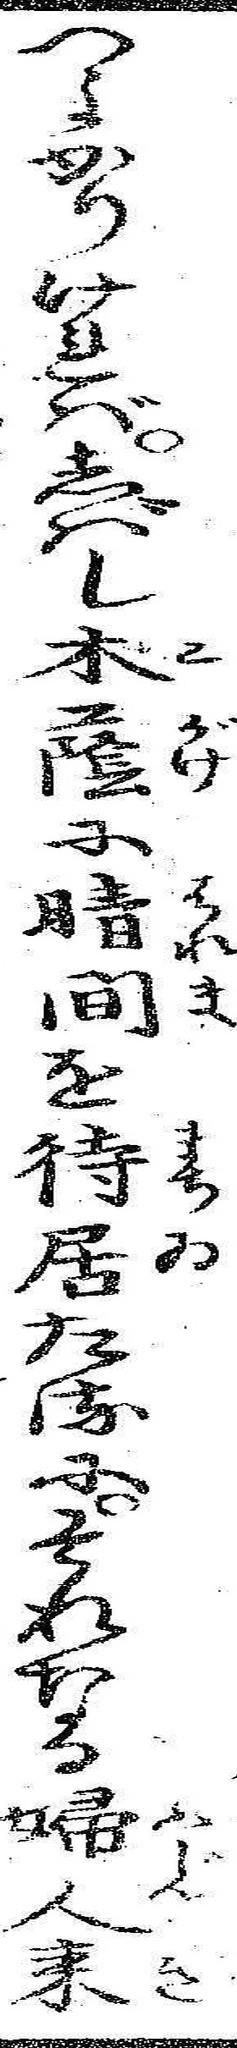つよかりければ。しばし木蔭に晴間を待居たるに。それなる婦人来
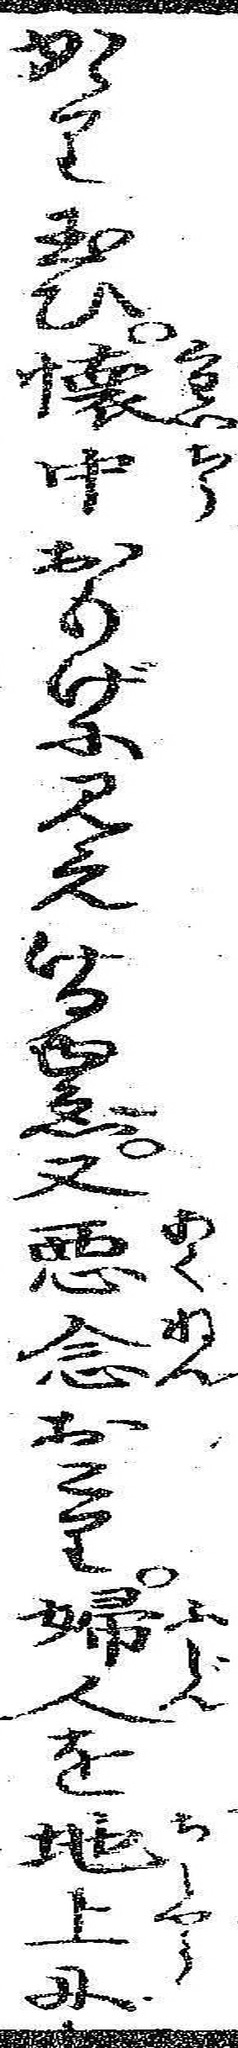かゝり玉ひ。懐中おもげに見えけるゆゑ。又悪念おこり。婦人を地上に
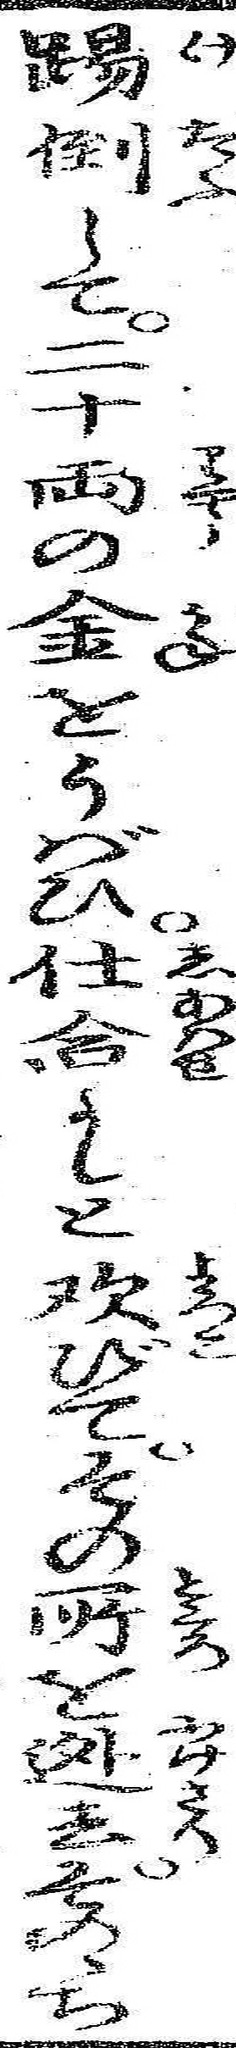踢倒して。二十両の金をうばひ。仕合よしと歓びて。その所を逃去。そのゝち
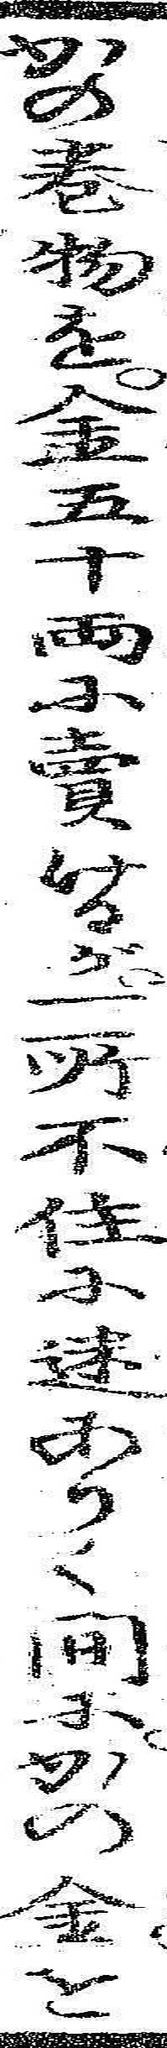かの巻物を。金五十両に売けるが。一所不住に迷ありく間に。かの金を
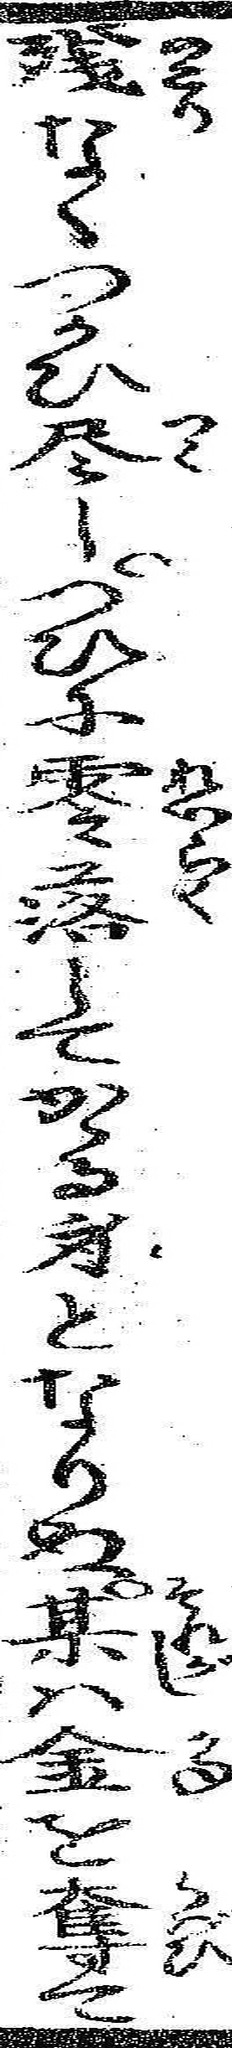残なくつかひ尽し。つひに零落してかゝる身となりぬ。某は金を奪て
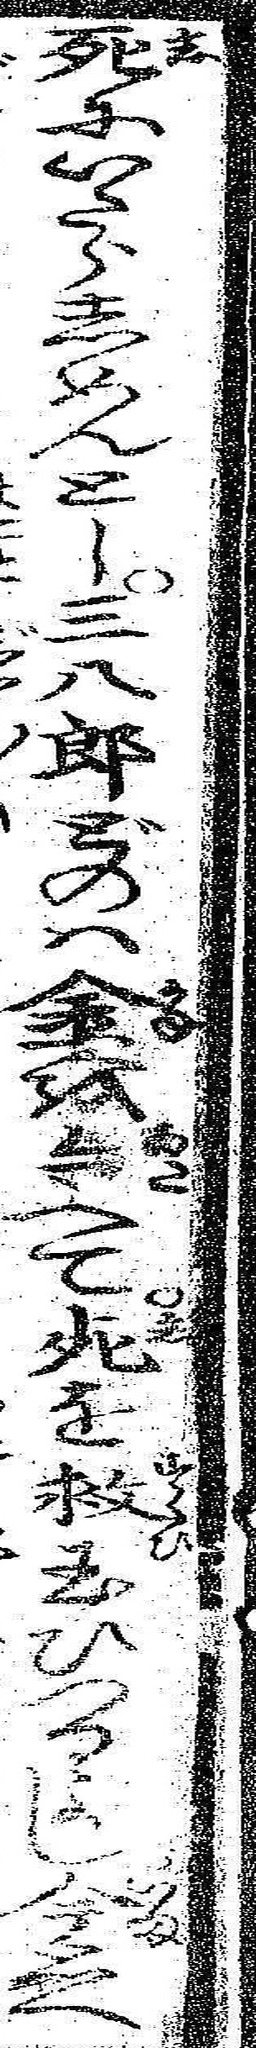死にいたらしめんとし。三八郎どのは金を与へて。死を救玉ひつるよし。今思へ
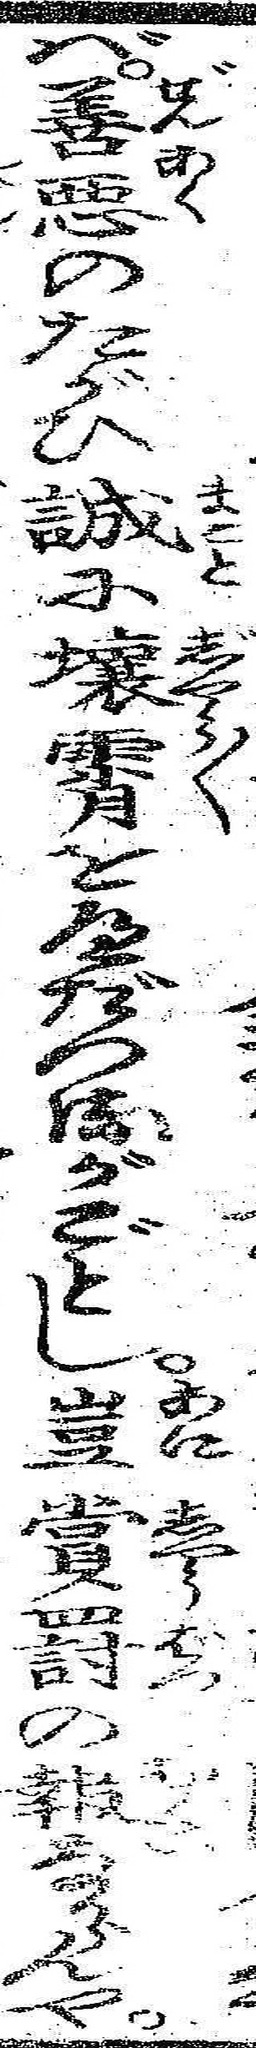ば。善悪のたがひ誠に壌霄をへだつるがごとし。豈賞罰の報なからんや。
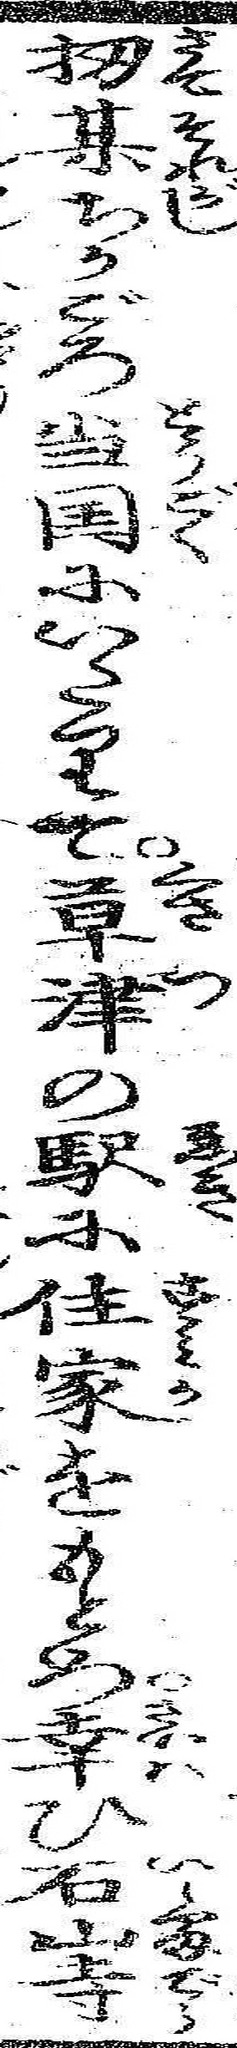扨某ちかごろ当国にいたりて。草津の駅に住家をもとめ。幸ひ石山寺
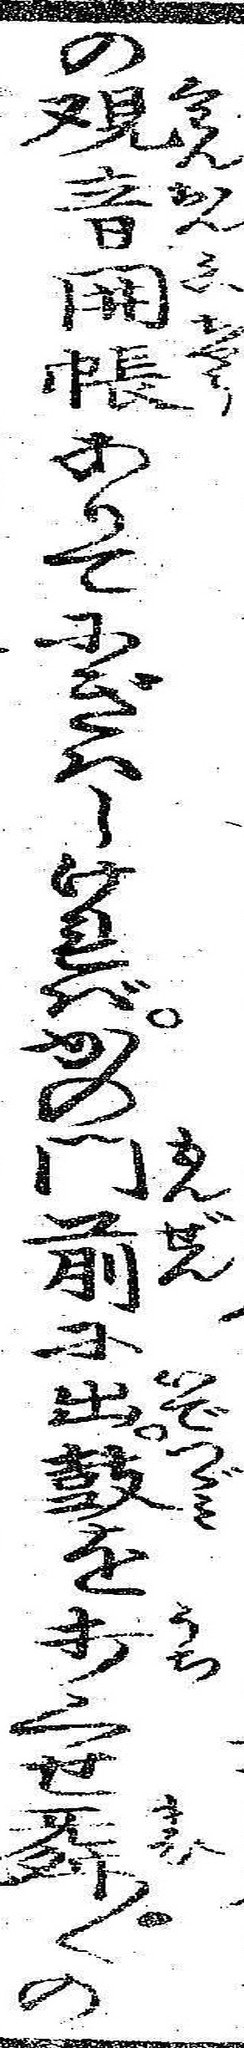の観音開帳ありてにぎはしければ。かの門前に出。鼓を打くせ舞の
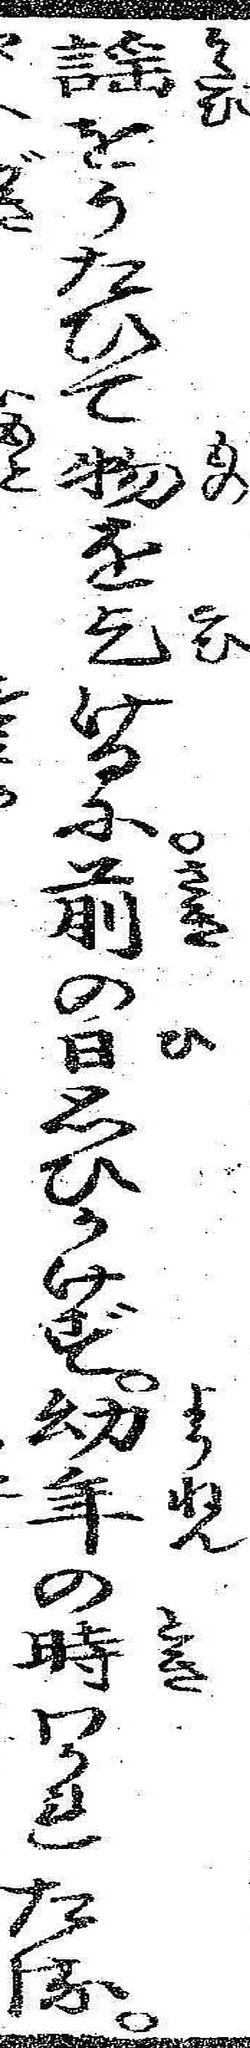謡をうたひて物を乞けるに。前の日思ひかけず。幼年の時わかれたる。
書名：昔話稲妻表紙
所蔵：国文学研究資料館
